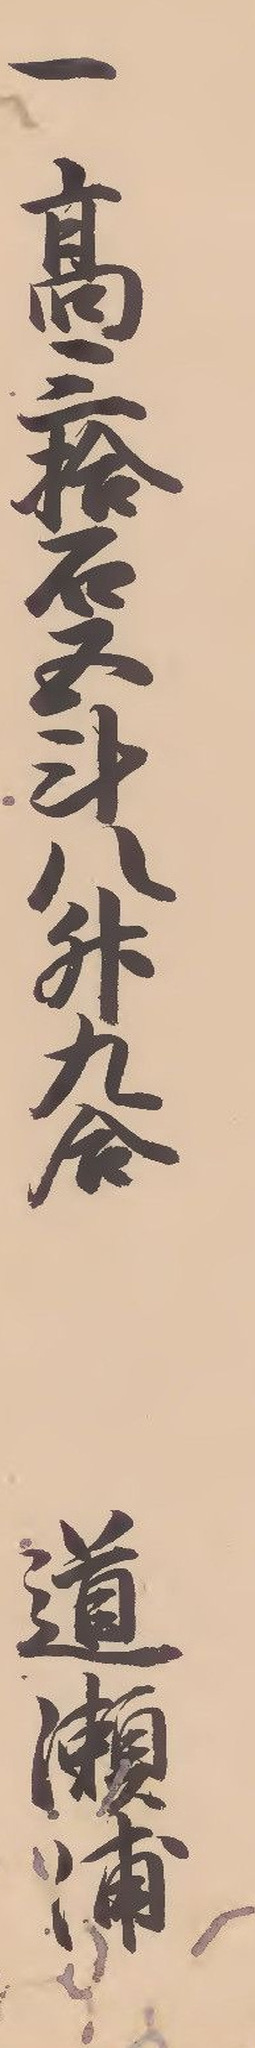一高三拾石五斗八升九合道瀬浦

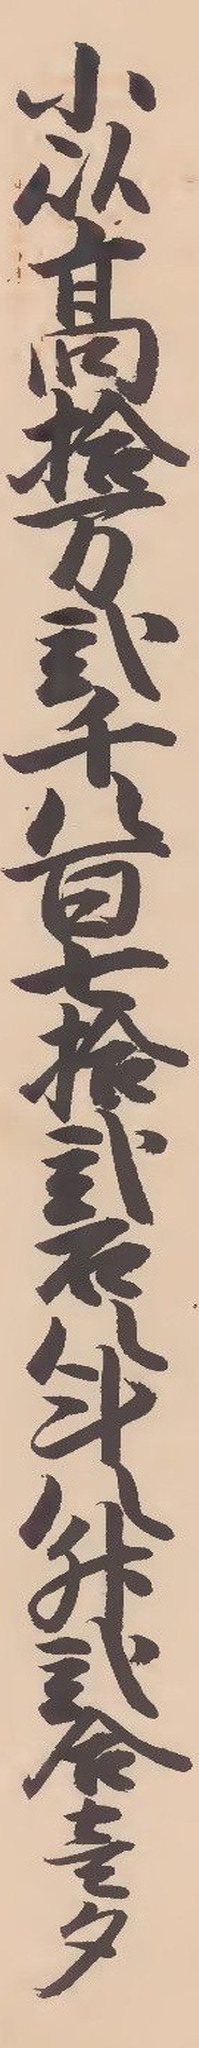小以高拾万弐千八百七拾弐石八斗八升弐合壱勺
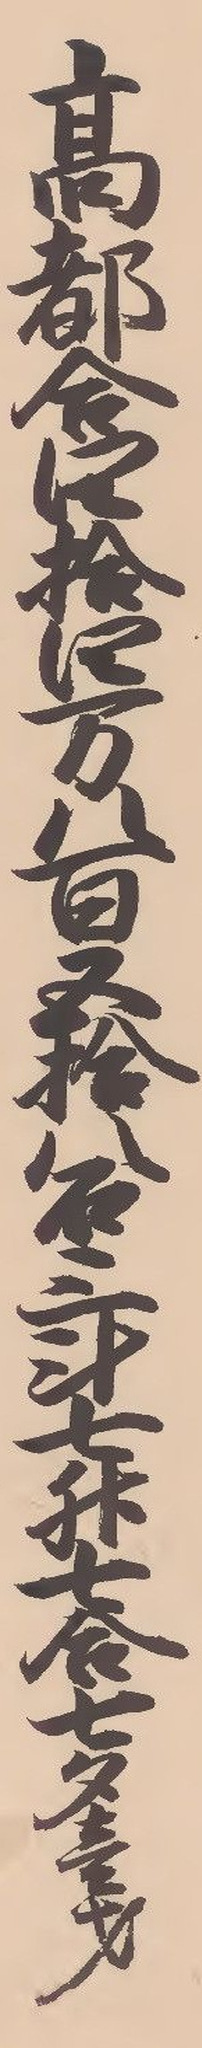高都合四拾四万八百五拾八石三斗七升七合七夕壱才
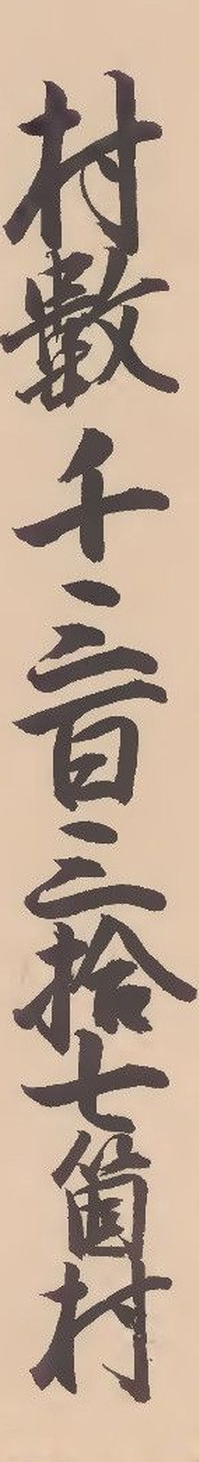村数千三百三拾七箇村
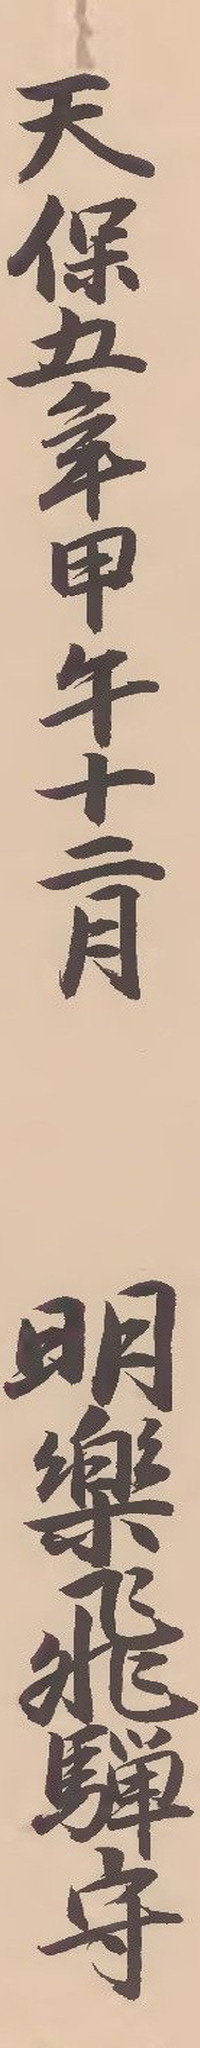天保五年甲午十二月明楽飛騨守
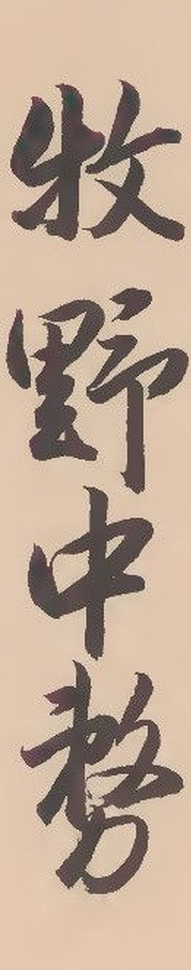牧野中務
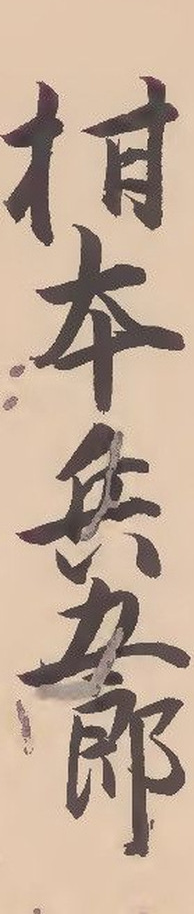柑本兵五郎
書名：紀伊国郷帳
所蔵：国立公文書館 National Archives of Japan
